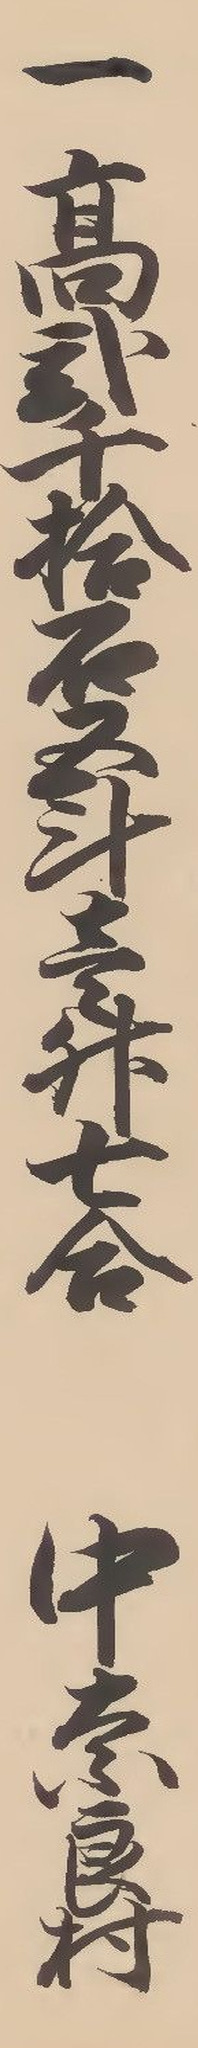一高弐千拾石五斗壱升七合中奈良村
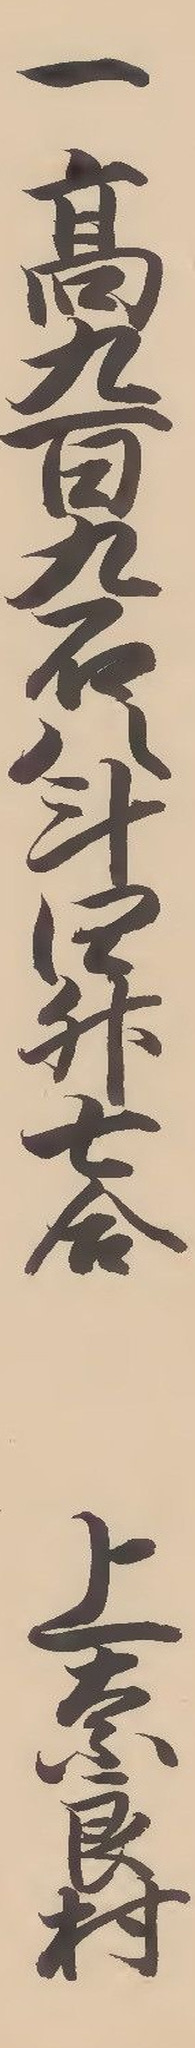一高九百九石八斗四升七合上奈良村
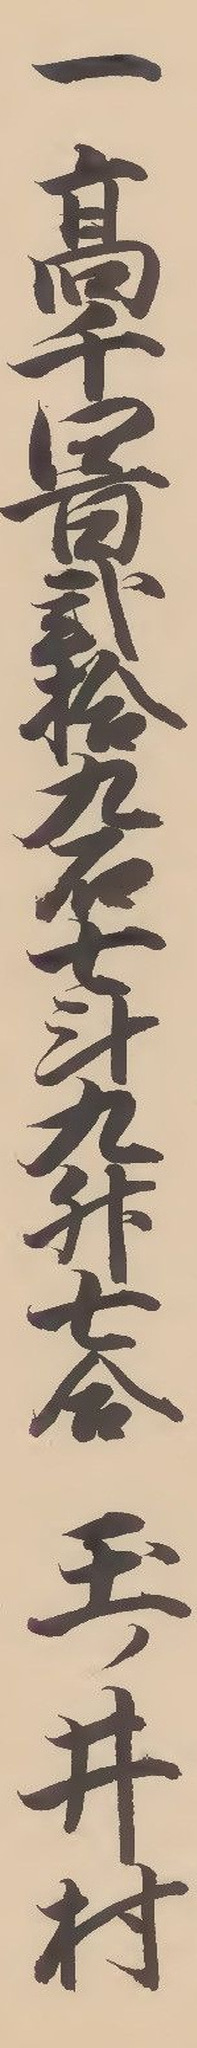一高千四百弐拾九石七斗九升七合玉ノ井村

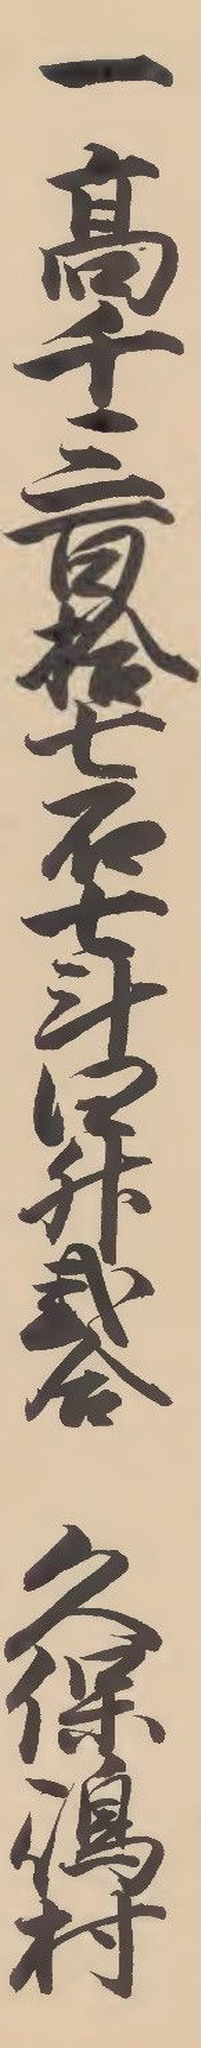一高千三百拾七石七斗四升弐合久保嶋村
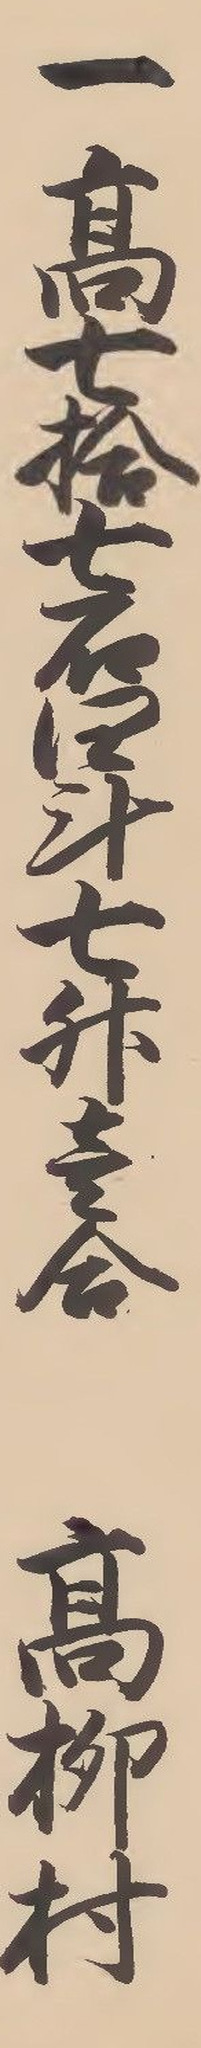一高七拾七石四斗七升壱合高柳村
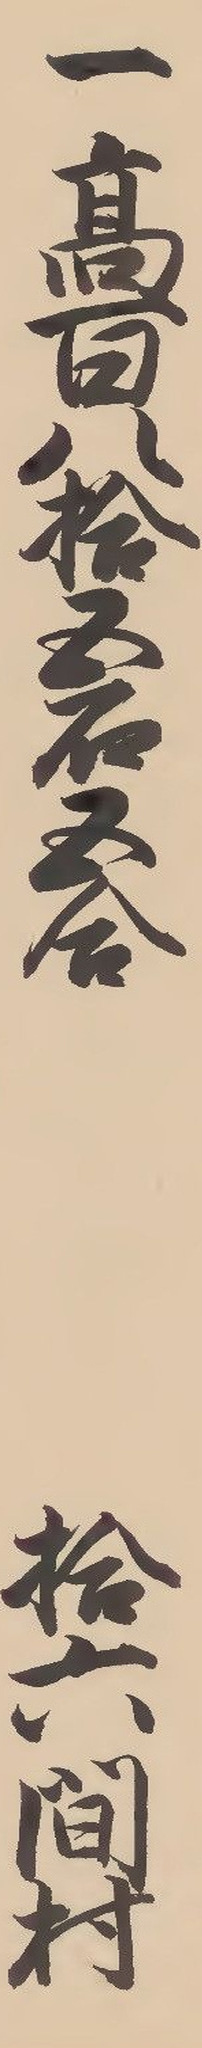一高百八拾五石五合拾六間村
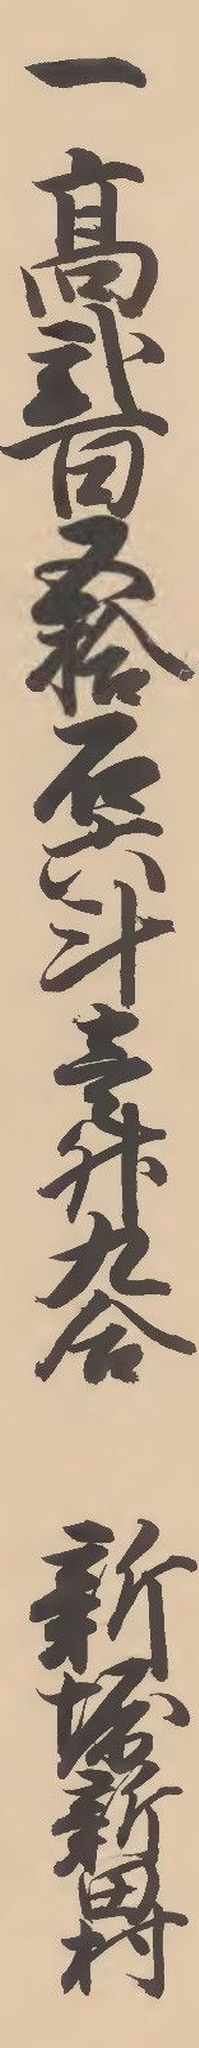一高弐百五拾石六斗壱升九合新堀新田村
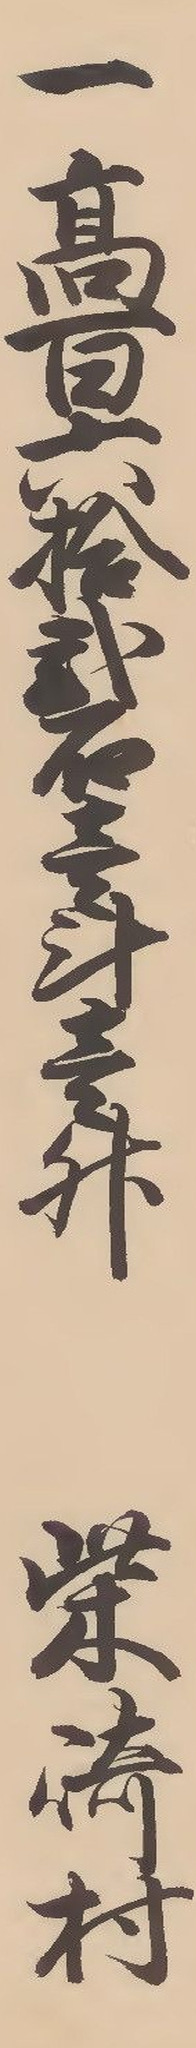一高百六拾弐石壱斗壱升柴崎村
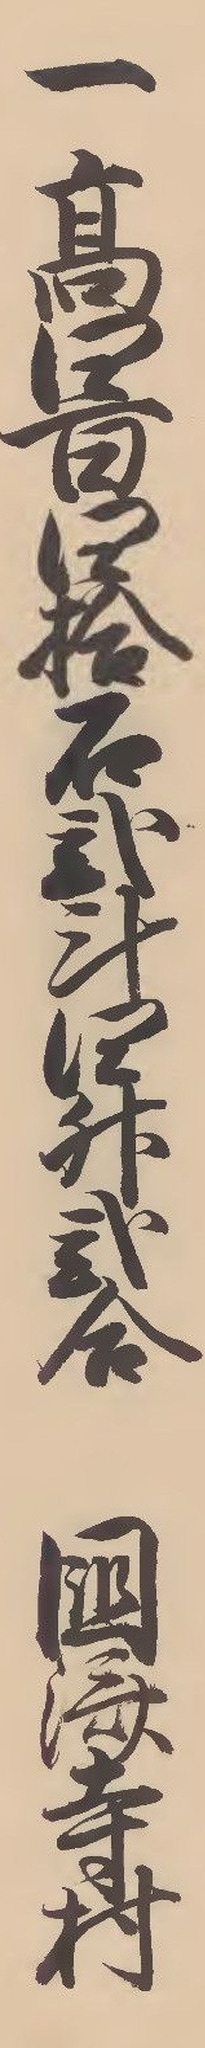一高四百四拾石弐斗四升弐合国済寺村

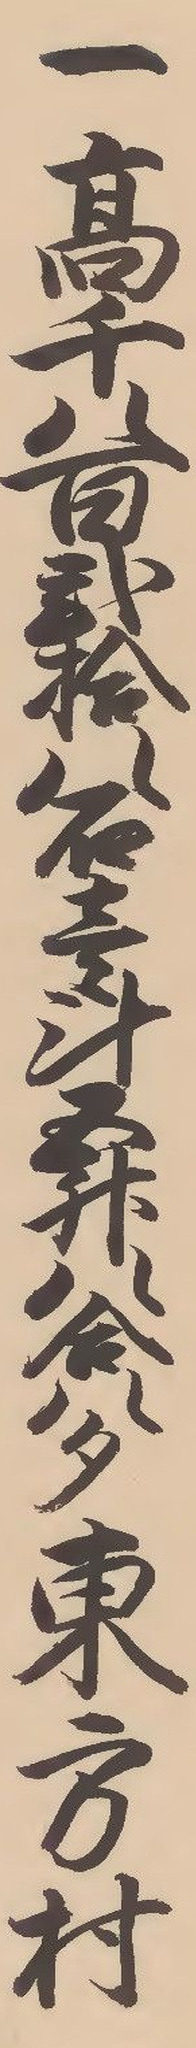一高千八百弐拾八石壱汁五升八合八勺東方村
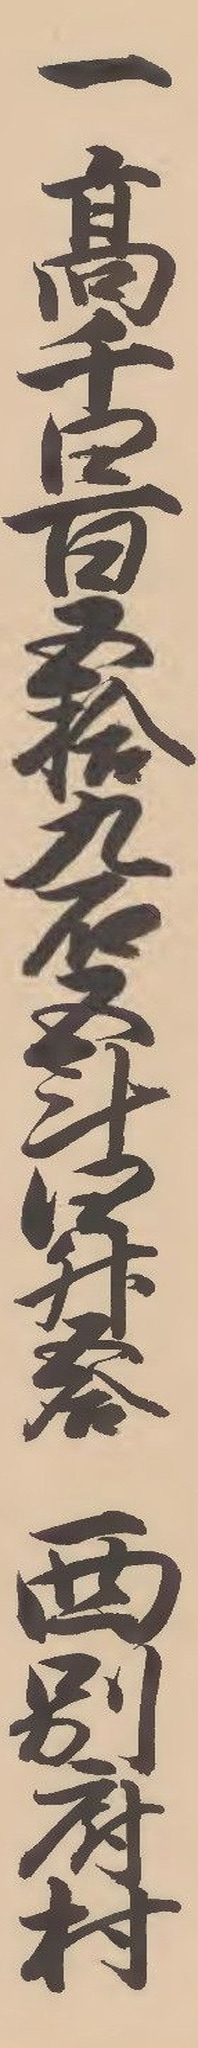一高千四百五拾九石五斗四升五合西別府村
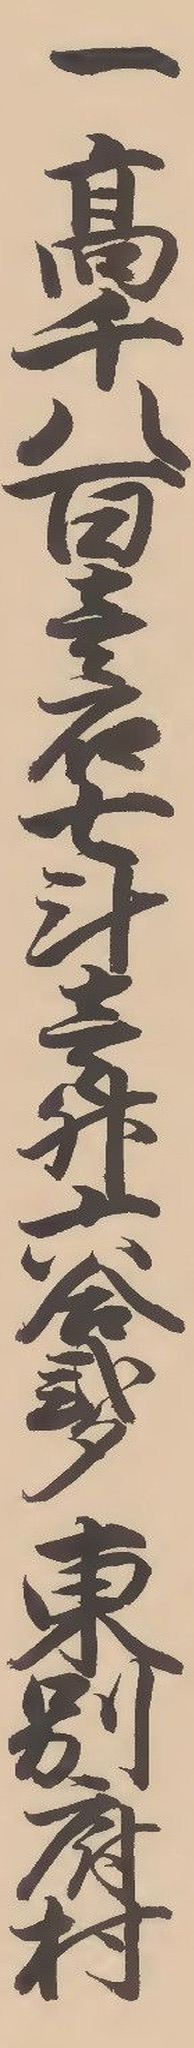一高千八百壱石七斗壱升六合弐勺東別府村
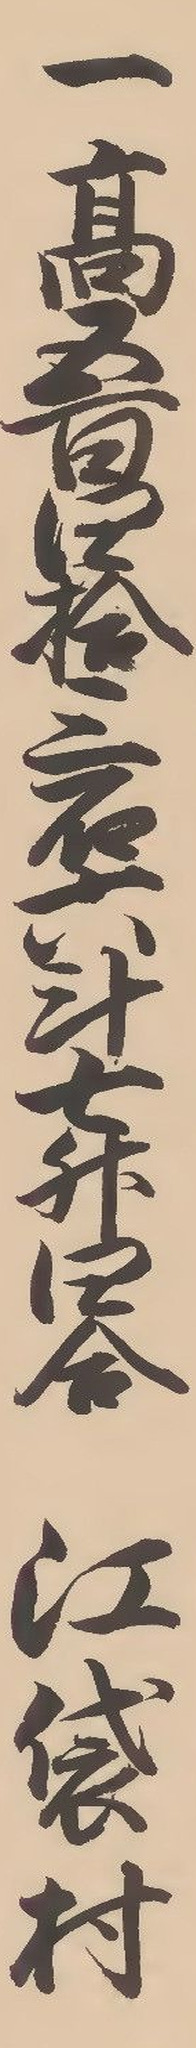一高五百四拾三石六斗七升四合江袋村
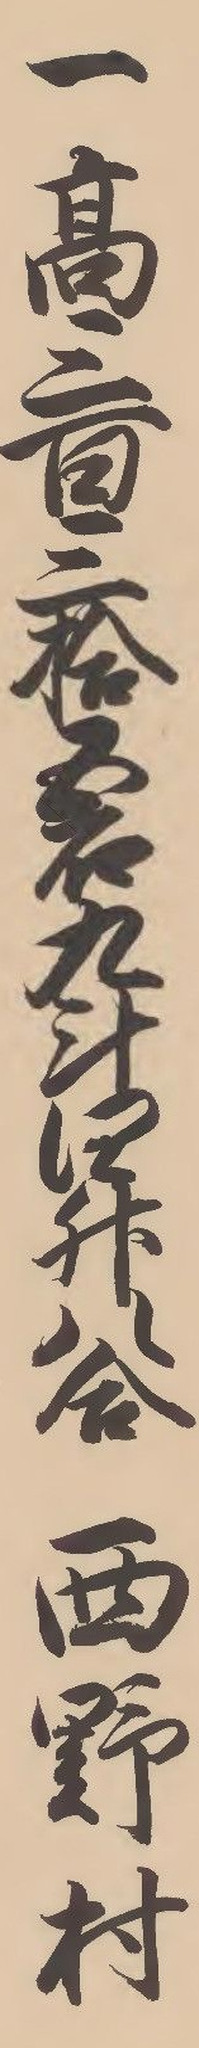一高三百三拾五石九斗四升八合西野村
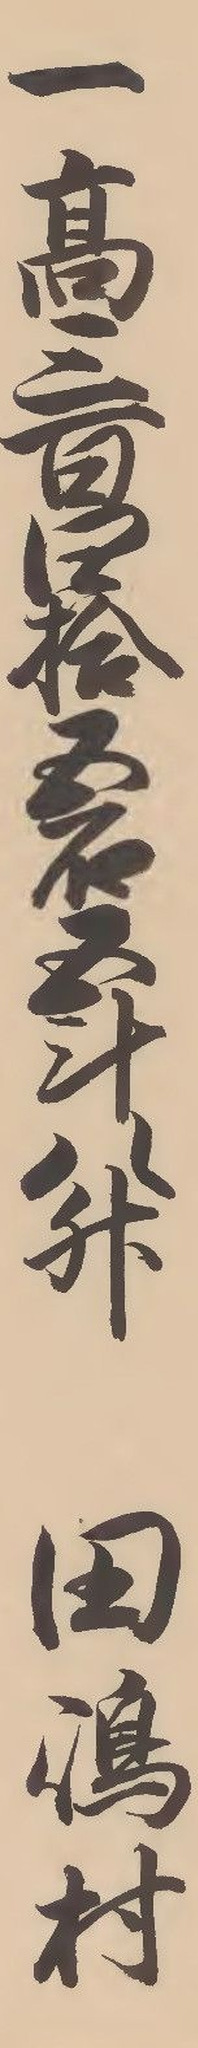一高三百四拾五石五斗八升田嶋村
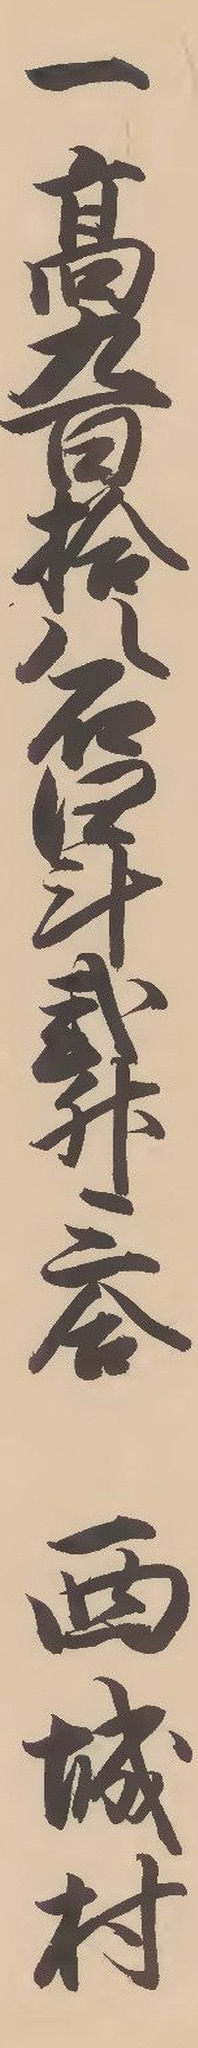一高九百拾八石四斗弐升三合西城村
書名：武蔵国郷帳　下
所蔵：国立公文書館 National Archives of Japan
